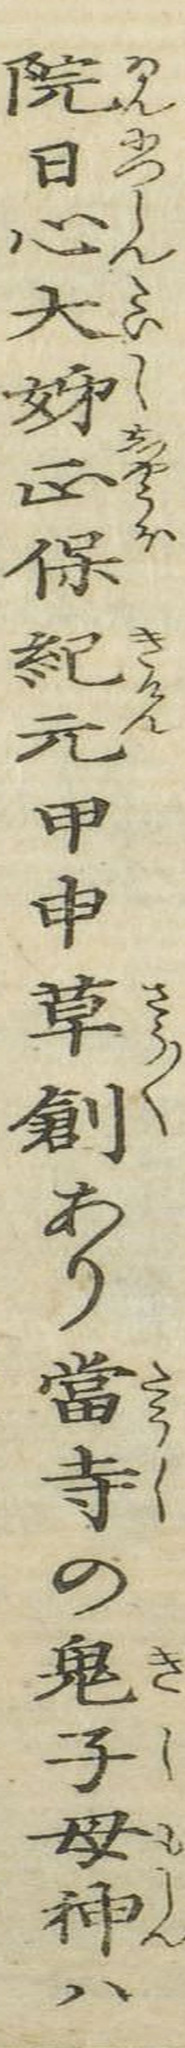院日心大姉正保紀元甲申草創あり当寺の鬼子母神は
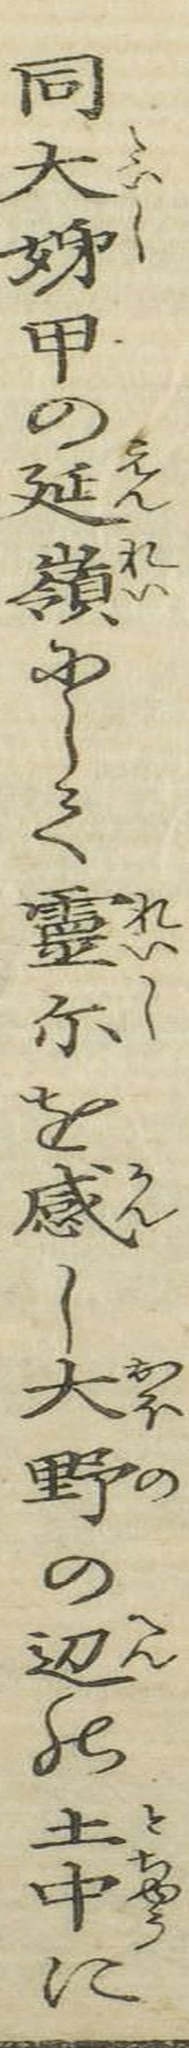同大姉甲の延嶺にして霊尓を感し大野の辺の土中に
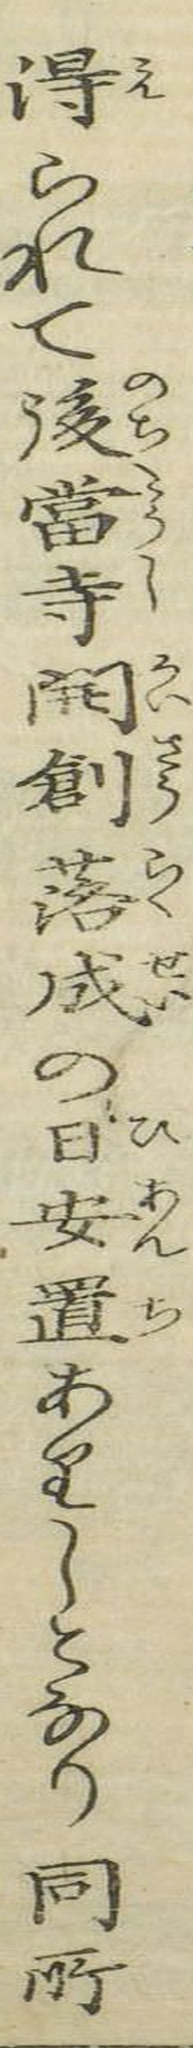得られて後当寺開創落成の日安置ありしとなり同所
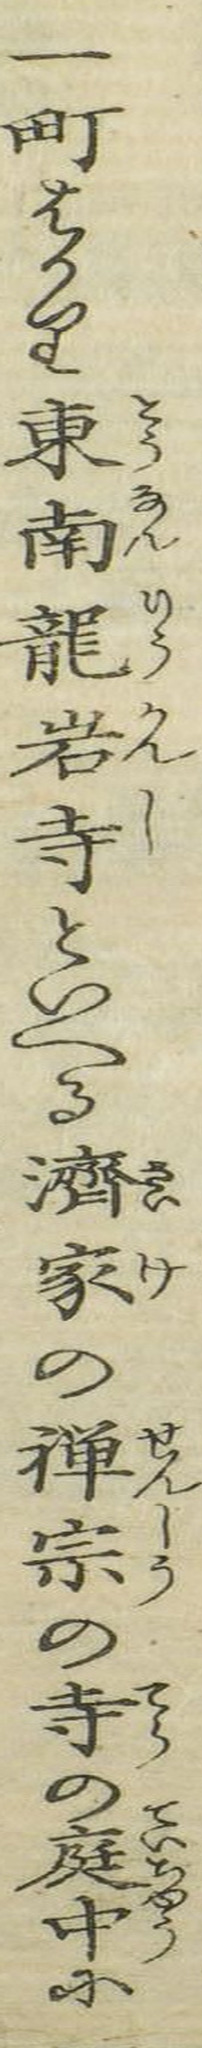一町はかり東南竜岩寺といへる済家の禅宗の寺の庭中に
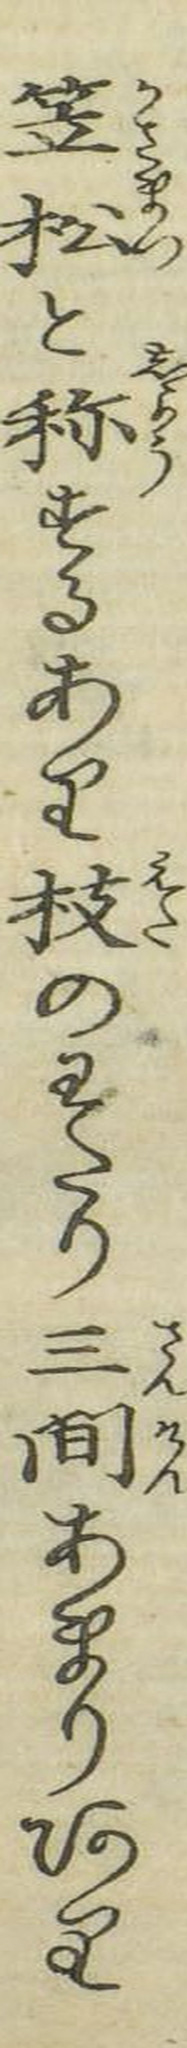笠松と称するあり枝のわたり三間あまりあり

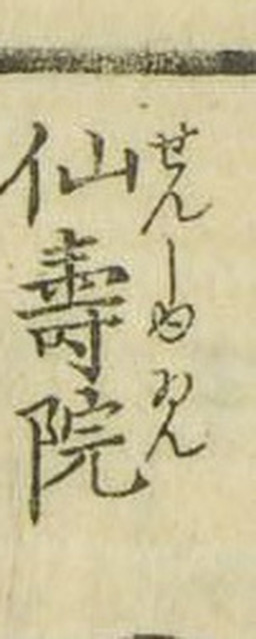仙寿院
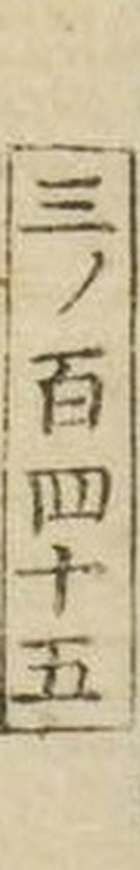三ノ百四十五

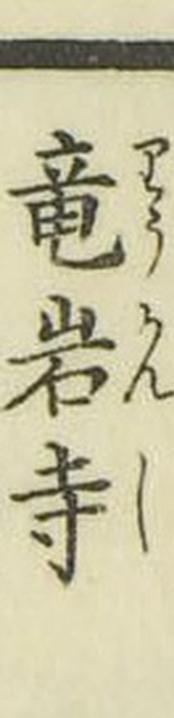竜岩寺
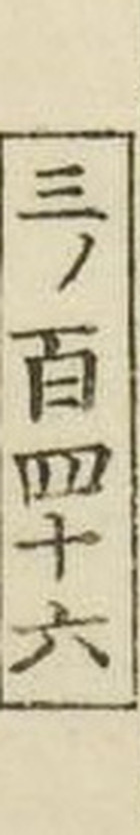三ノ百四十六

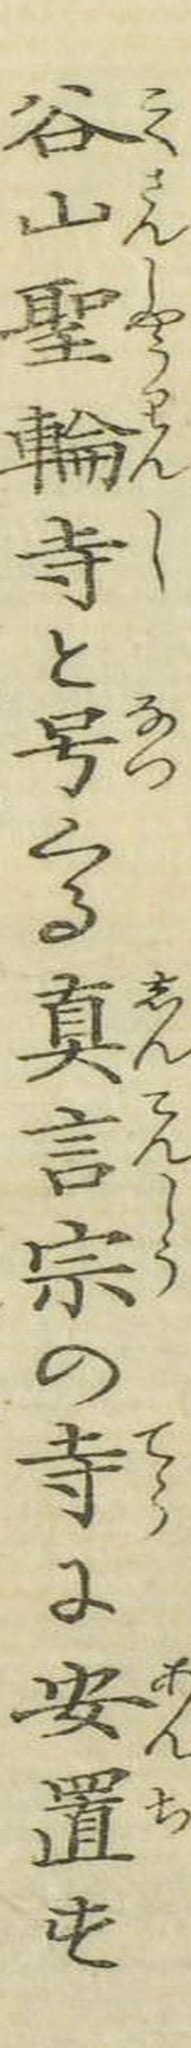谷山聖輪寺と号くる真言宗の寺に安置す
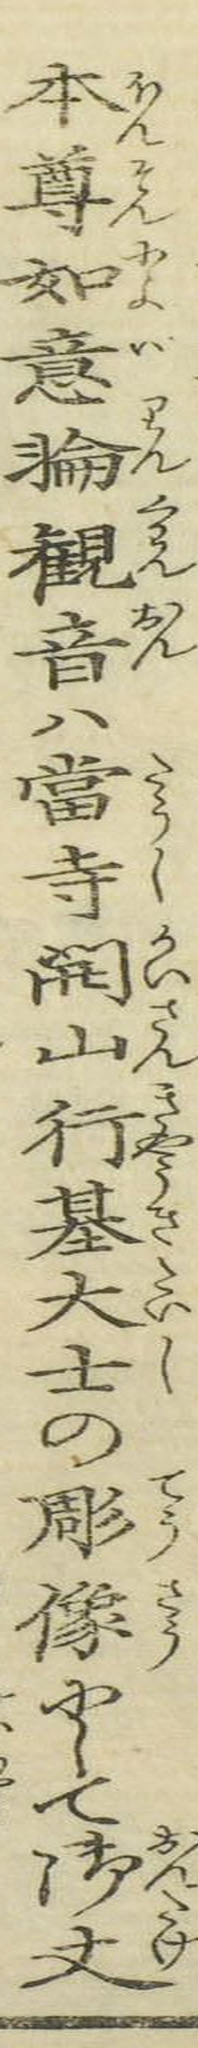本尊如意輪観音は当寺開山行基大士の彫像にして御丈
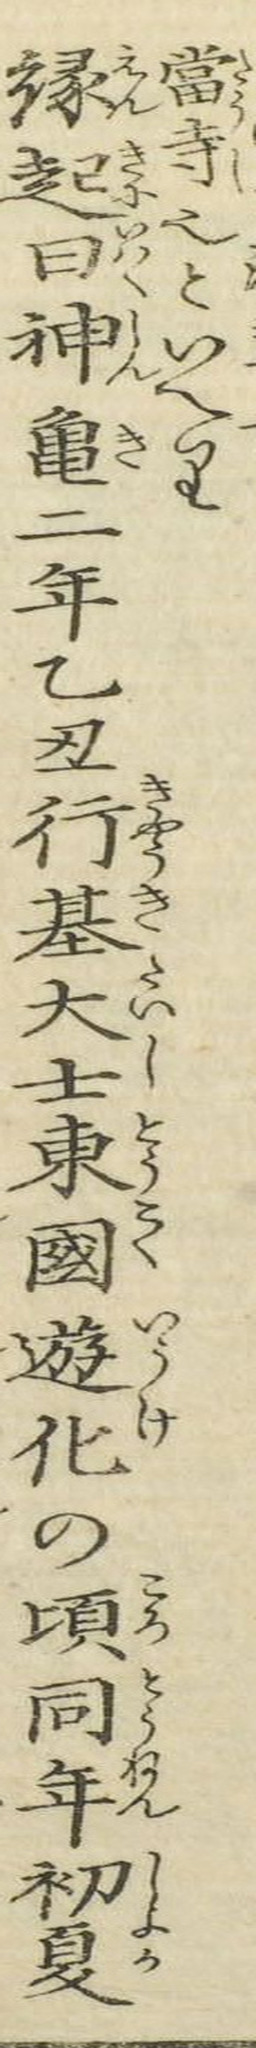縁起曰神亀二年乙丑行基大士東国遊化の頃同年初夏
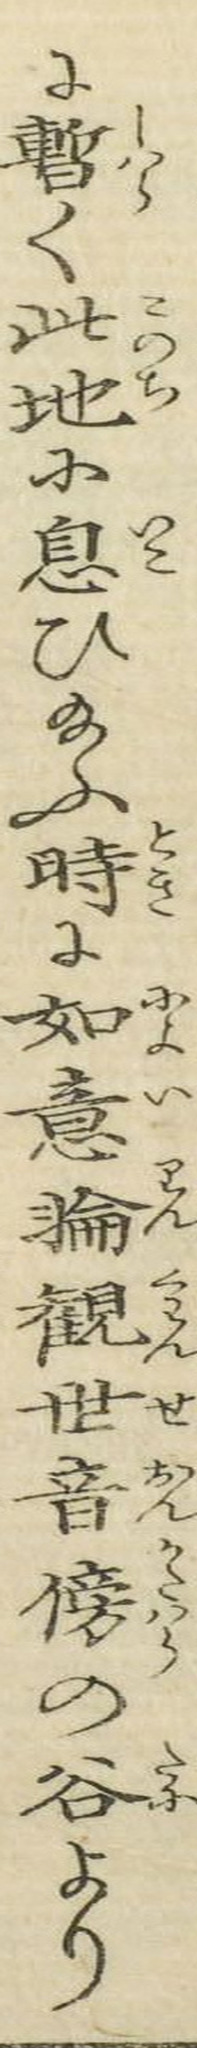に暫く此地に息ひ給ふ時に如意輪観世音傍の谷より
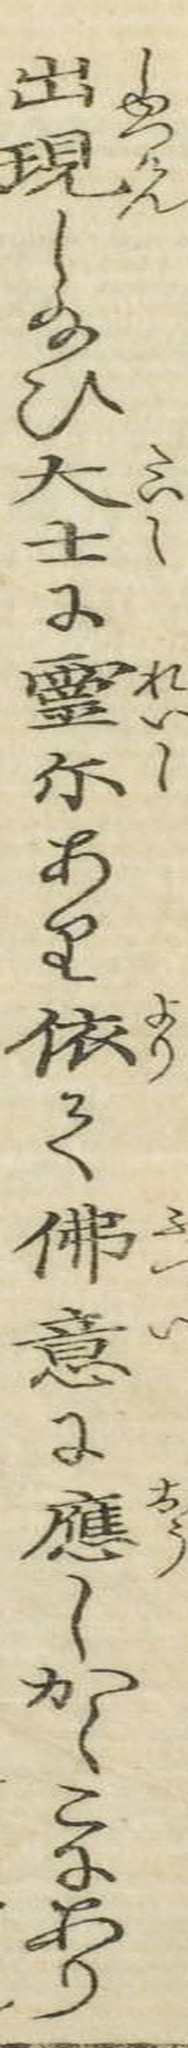出現し給ひ大士に霊尓あり依て佛意に応しかしこにあり
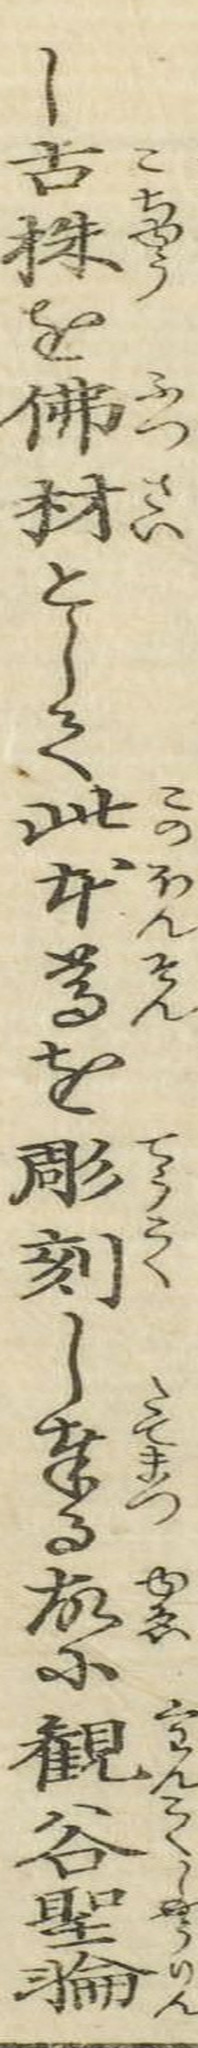し古株を佛材として此本尊を彫刻し奉る故に観谷聖輪
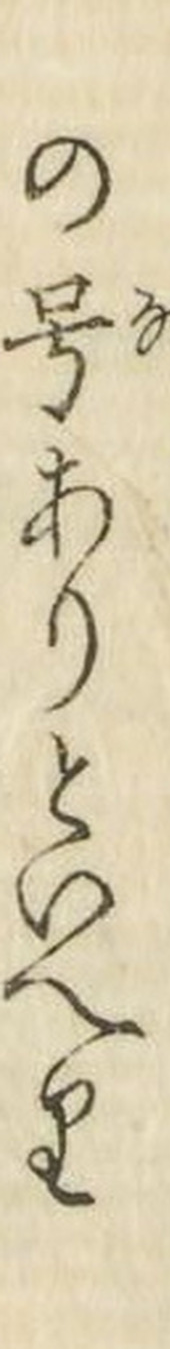の号ありといへり
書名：江戸名所図会 20巻 巻之9
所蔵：東京学芸大学教育コンテンツアーカイブ
